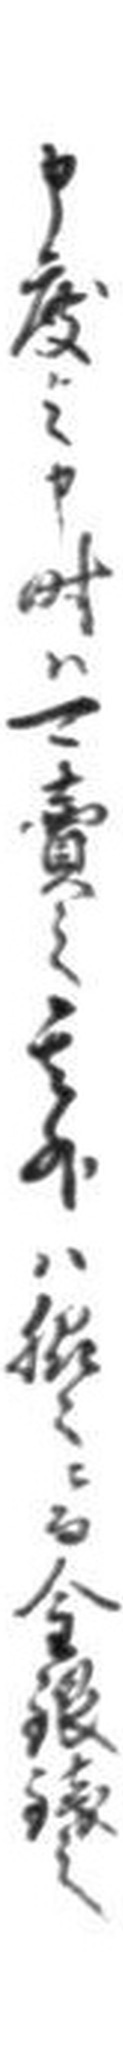申度与申時ハ可売之其外ハ脇々ニ而金銀銭之
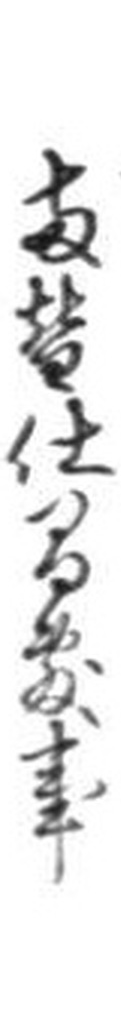両替仕間敷事
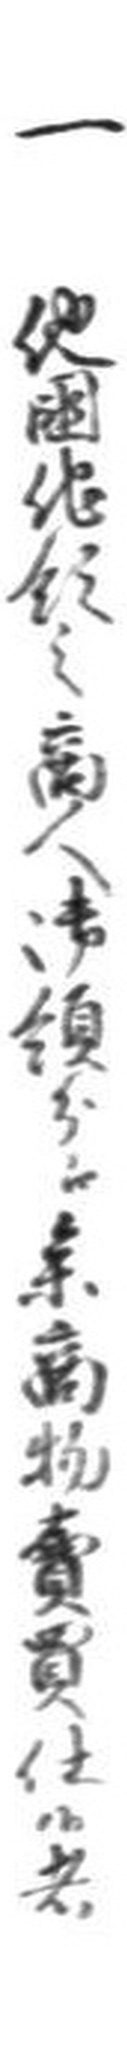一他国他領之商人御領分江参商物売買仕候者
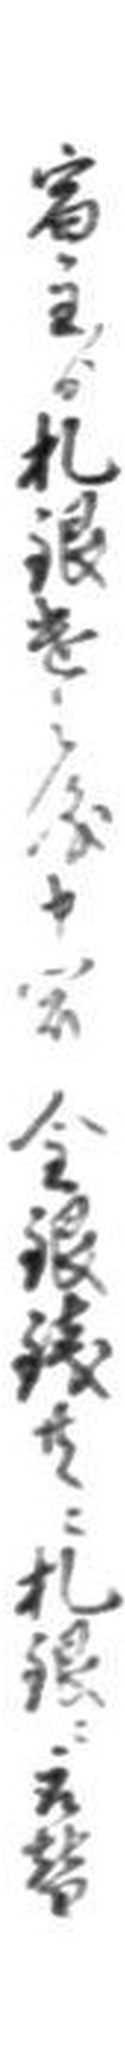宿主ゟ札銀遣之儀申聞金銀銭共ニ札銀ニ取替
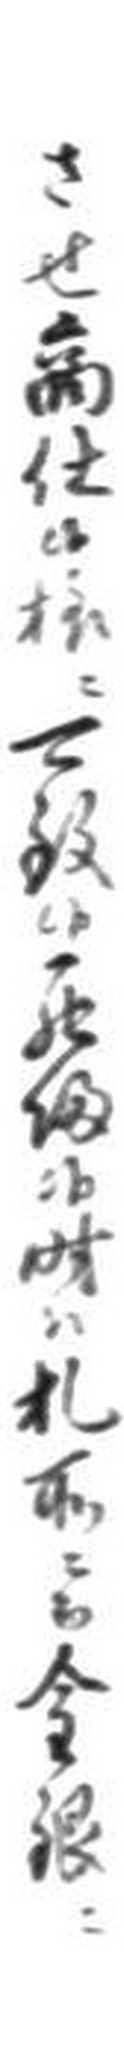させ商仕候様ニ可致候罷帰候時ハ札所ニ而金銀ニ
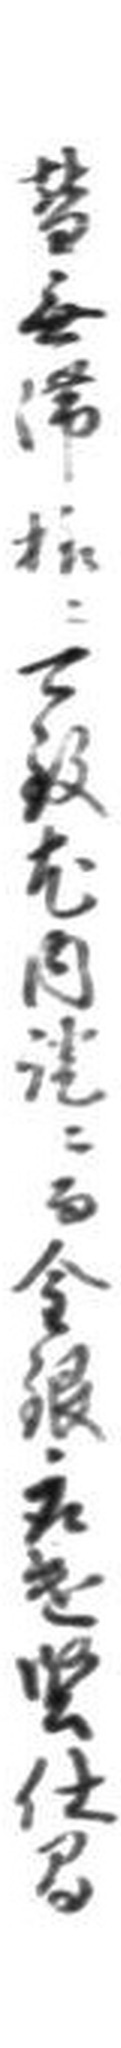替無滞様ニ可致尤内証ニ而金銀取遣堅仕間
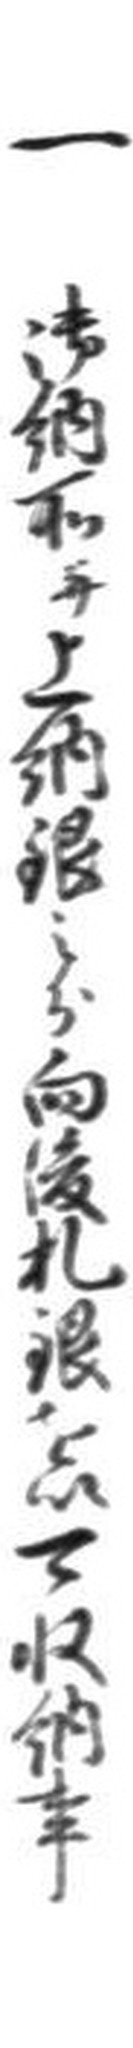一御納所并上納銀之分向後札銀を以可収納事
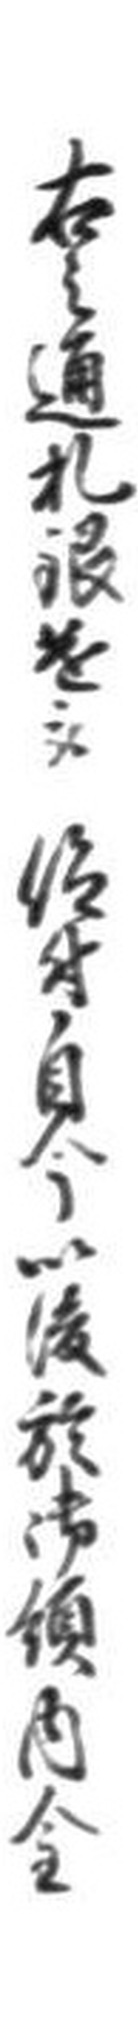右之通札銀遣被仰付自今以後於御領内金

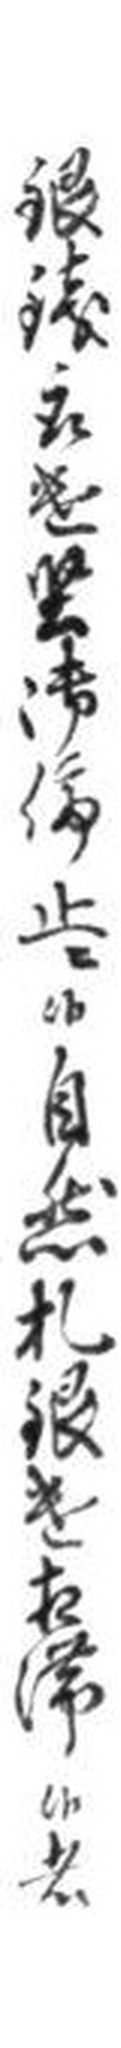銀銭取遣堅御停止ニ候自然札銀遣相滞候者
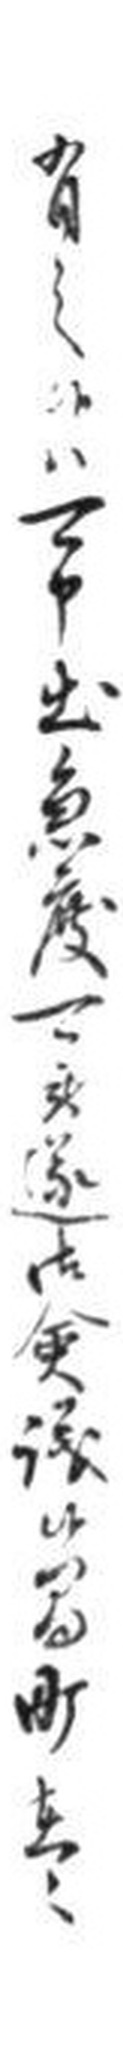有之候ハ可申出急度可被遂御僉議候間町在之
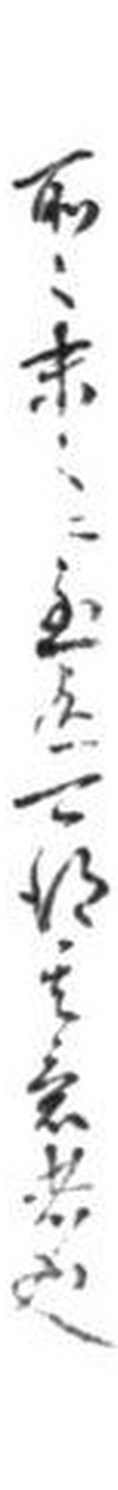所々末々ニ至迄可得其意者也
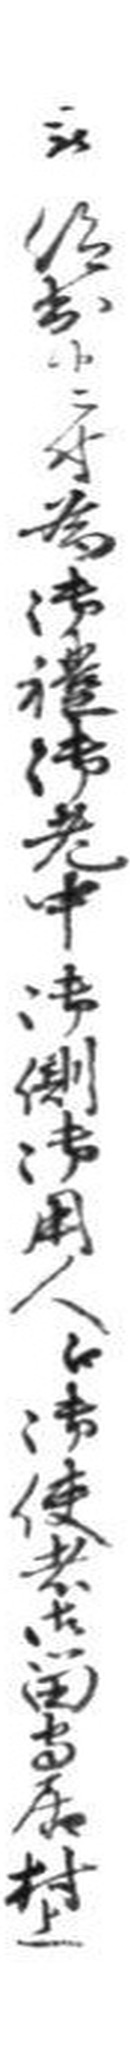被仰出候ニ付為御礼御老中御側御用人江御使者御留守居村上
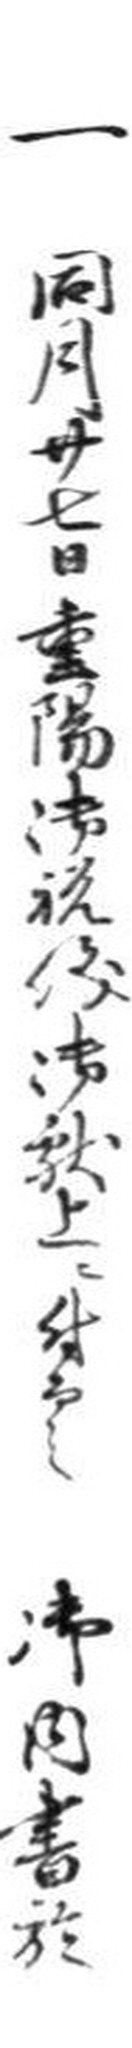一同月廿七日重陽御祝儀御献上ニ付而之御内書於
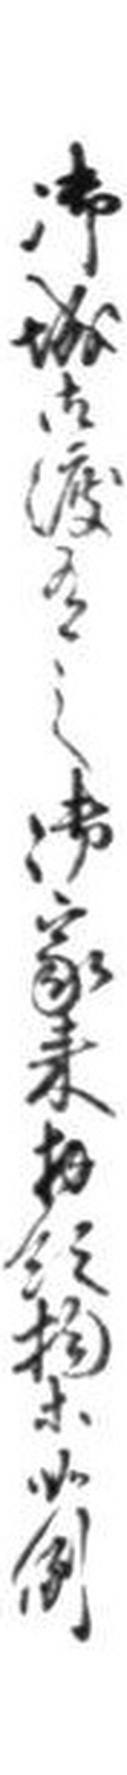御城御渡有之御家来拝領物如例
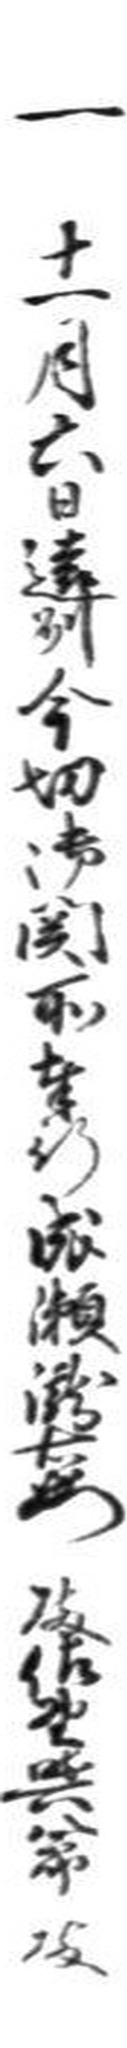一十一月六日遠州今切御関所奉行成瀬瀧右衛門殿佐野与八郎殿
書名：家譜 二十二 吉品公 従元禄十五年到同十六年
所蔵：福井県文書館 Fukui Prefectural Archives
